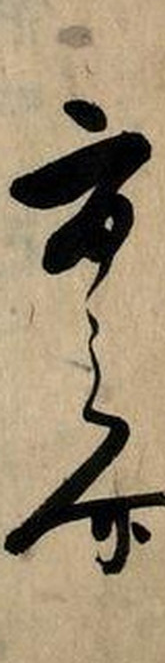市之介
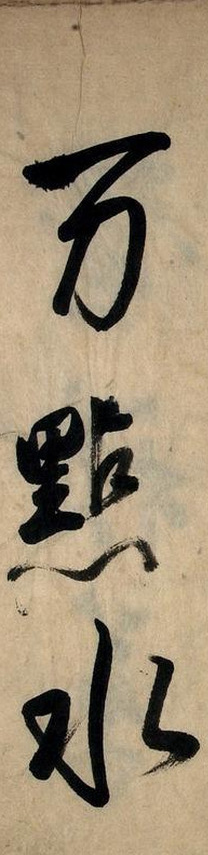万点水

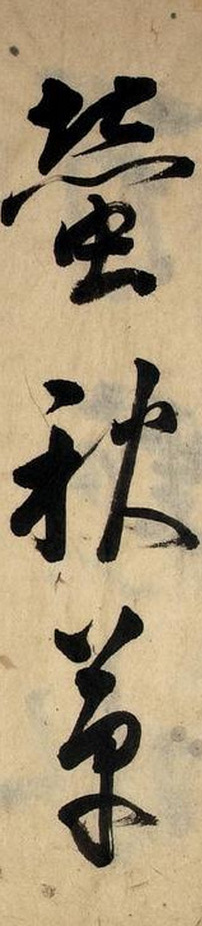蛍秋草
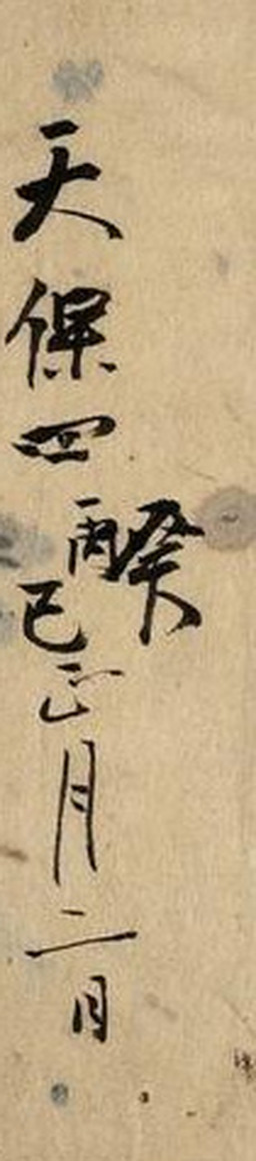中天保四丙巳正月二日
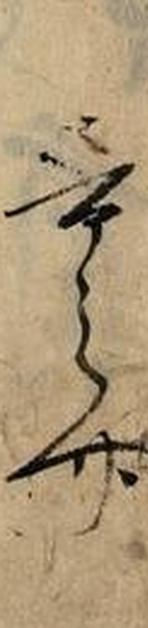市之介
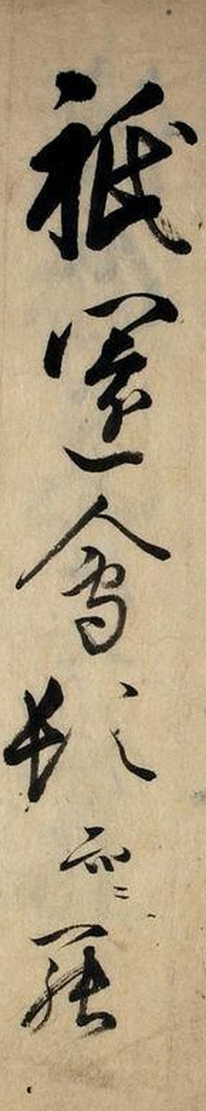祇園会頓而ニ罷
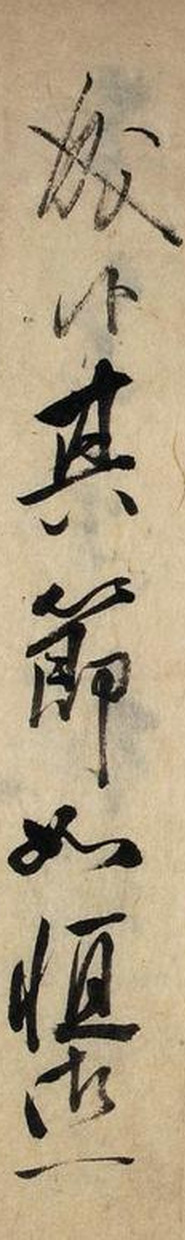成候其節如恒御一
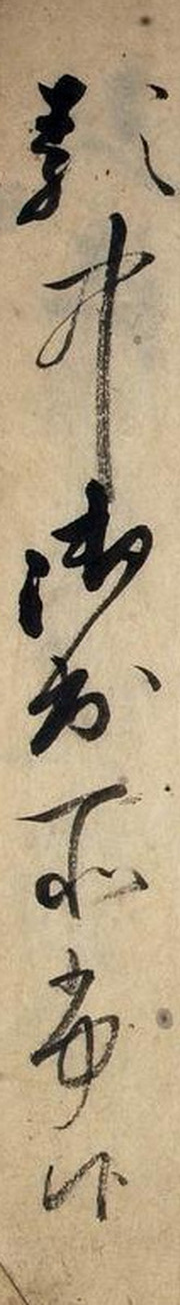類中御出所希候

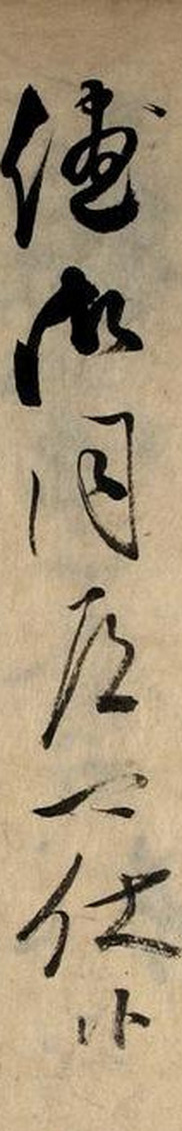儘御同道可仕候
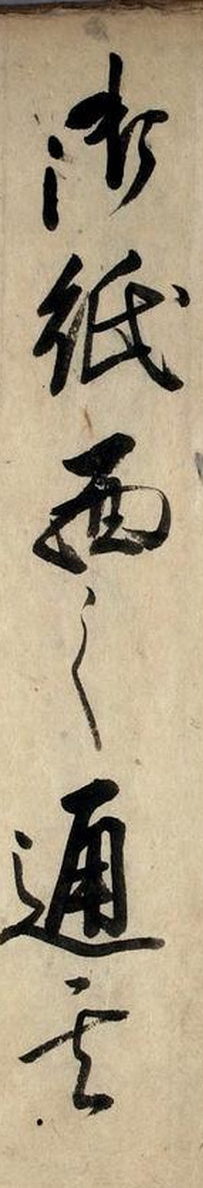御紙面之通其
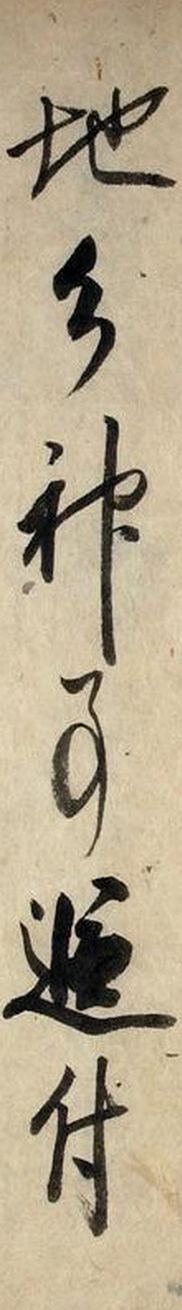地御神事追付
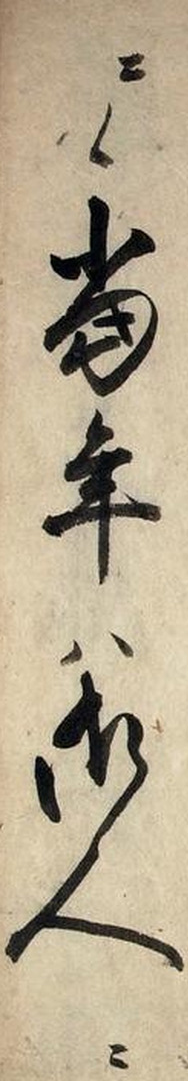ニ候当年ハ御人ニ

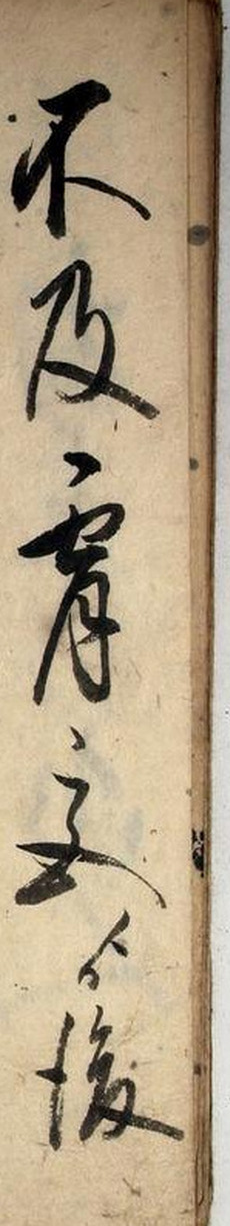不及宵宮ゟ後
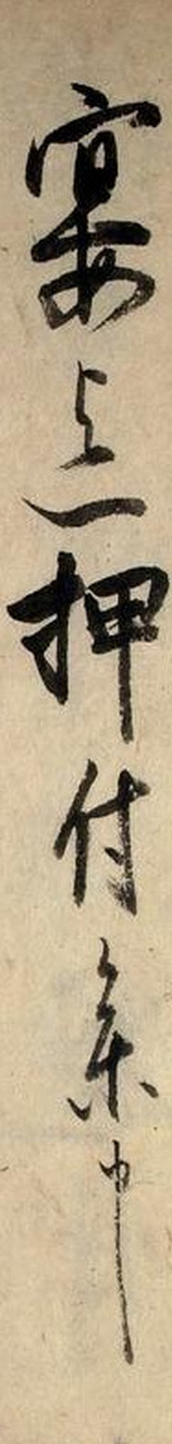宴迄押付参申
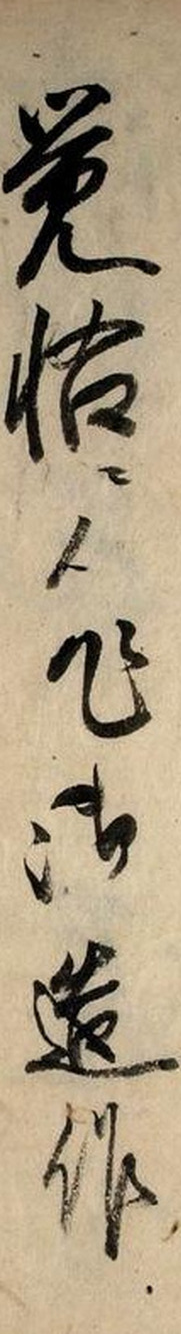覚悟ニ候乍御造作
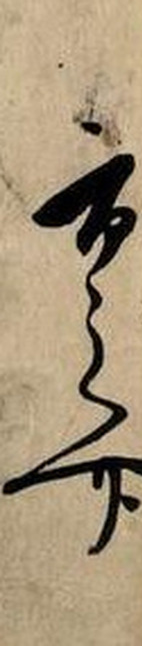市之介
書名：御手本（手習、消息文、和漢朗詠集・論語の一節）
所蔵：福井県文書館 Fukui Prefectural Archives
